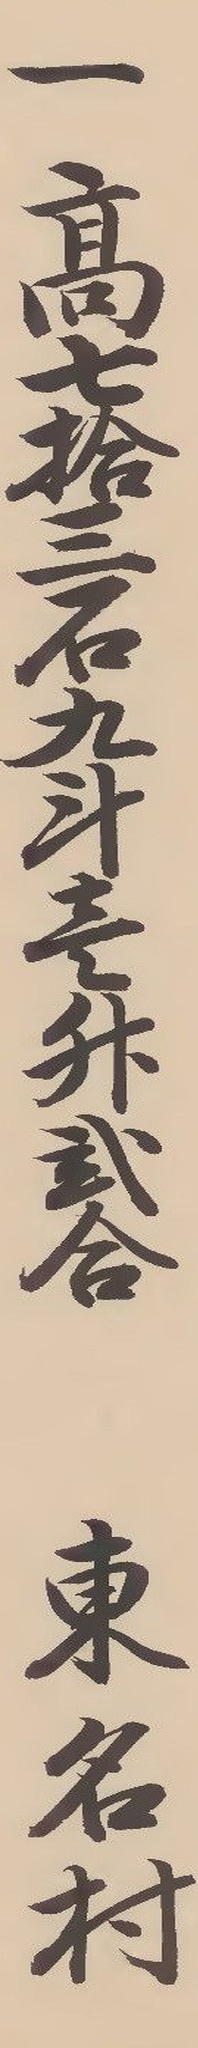一高七拾三石九斗壱升弐合東名村
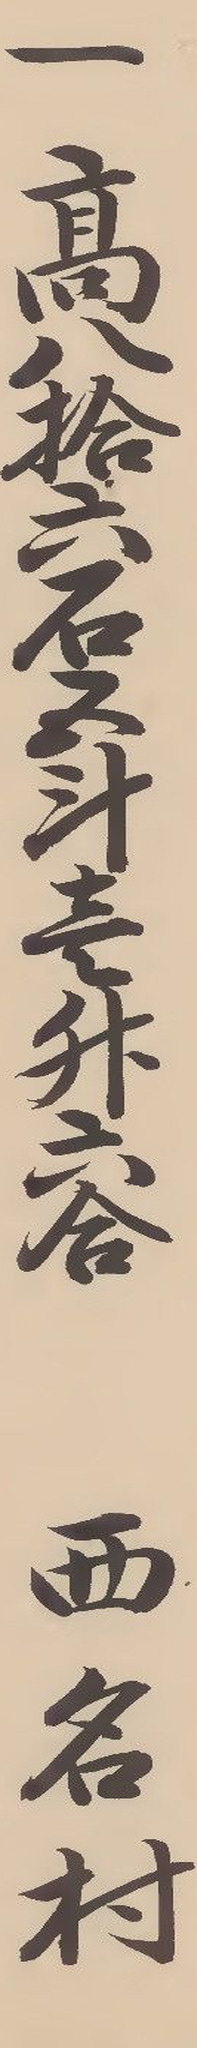一高八拾六石五斗壱升六合西名村
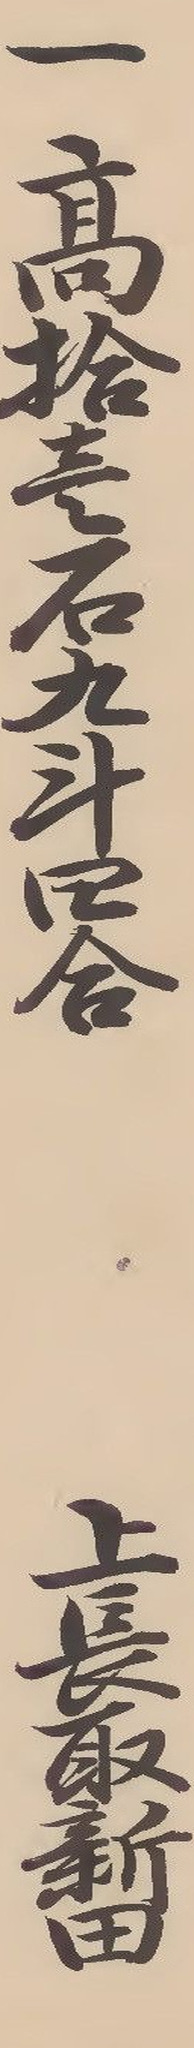一高拾壱石九斗四合上長取新田

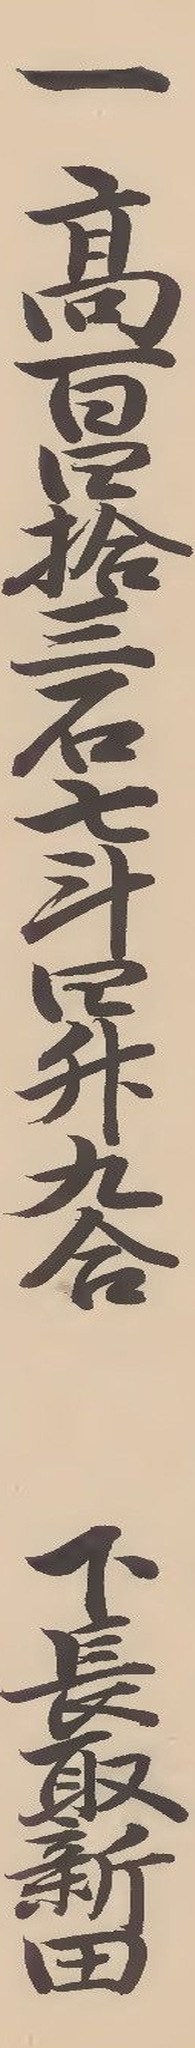一高百四拾三石七斗四升九合下長取新田
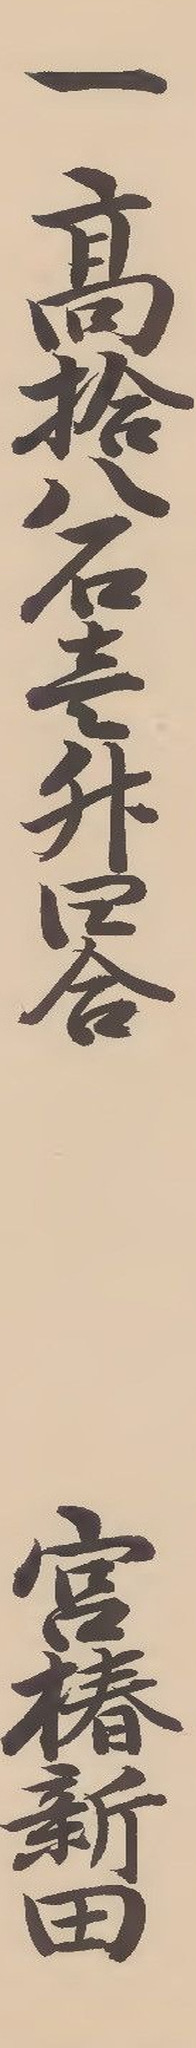一高拾八石壱升四合宮椿新田
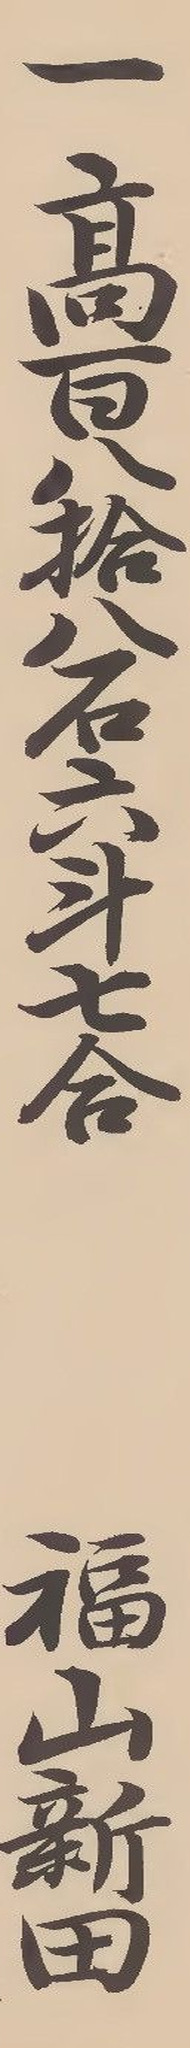一高百八拾八石六斗七合福山新田
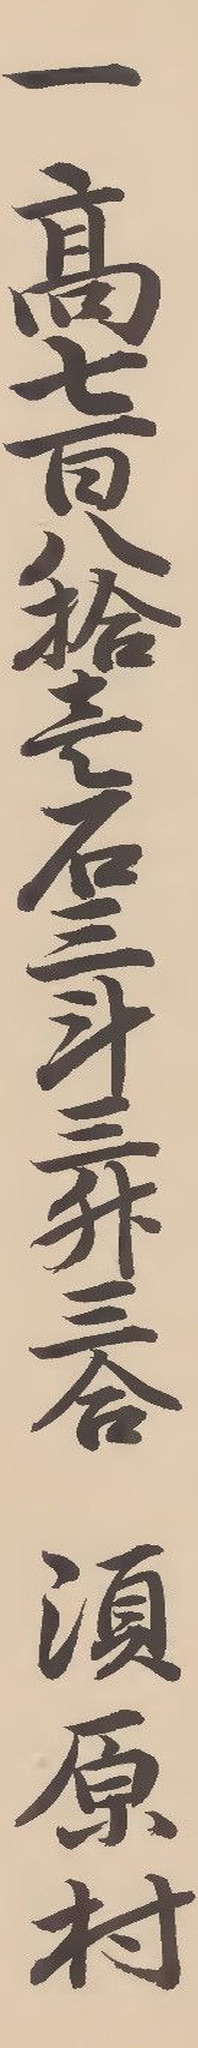一高七百八拾壱石三斗三升三合須原村
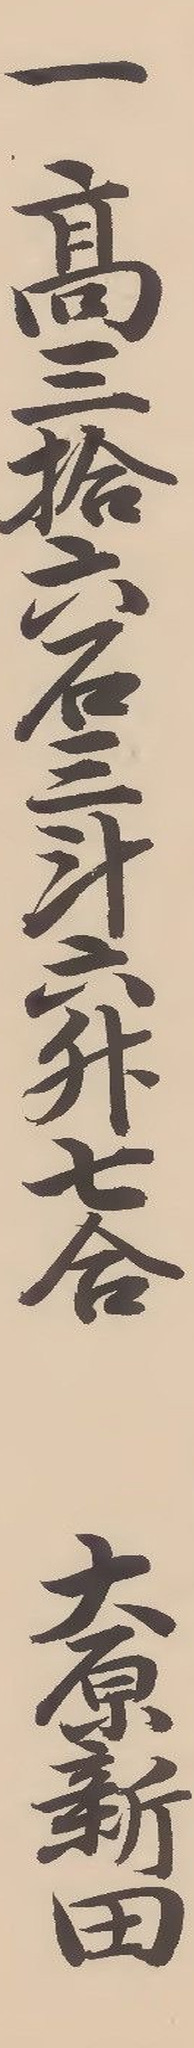一高三拾六石三斗六升七合大原新田
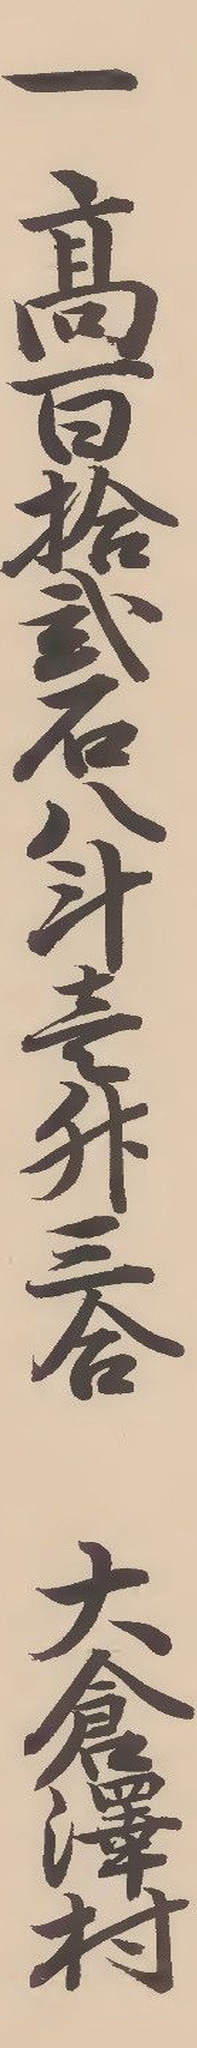一高百拾弐石八斗壱升三合大倉沢村
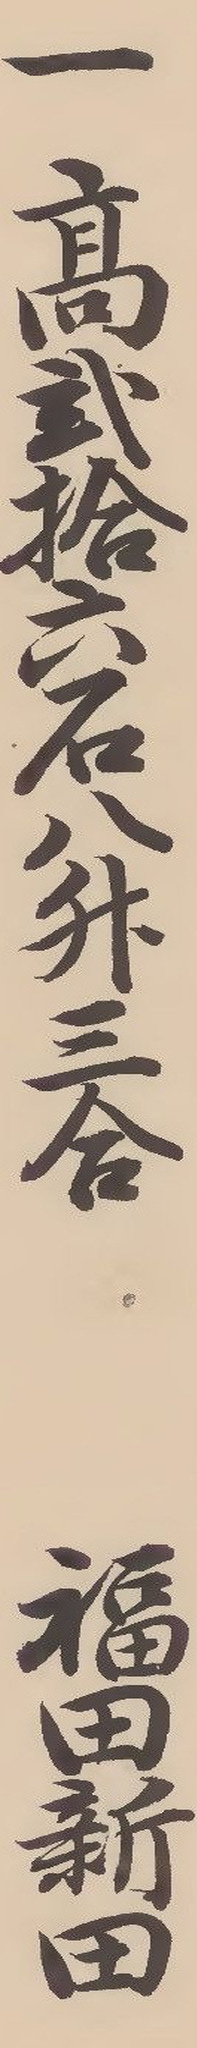一高弐拾六石八升三合福田新田

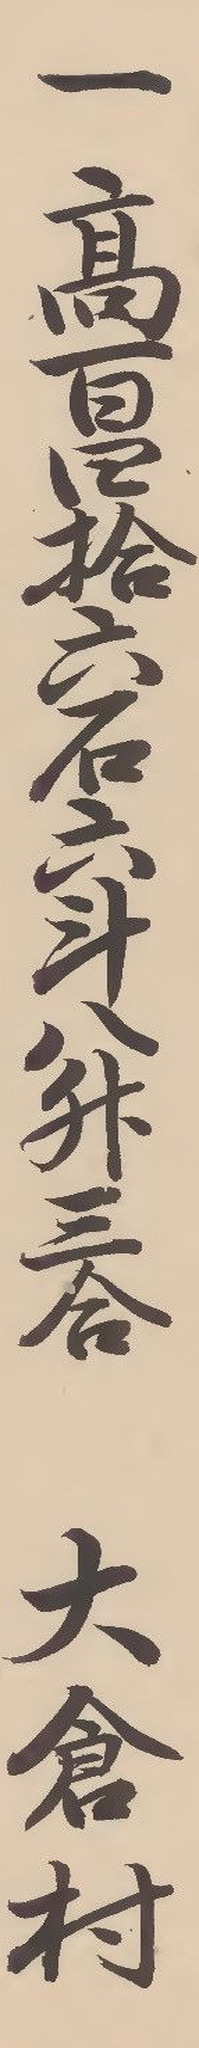一高百四拾六石六斗八升三合大倉村
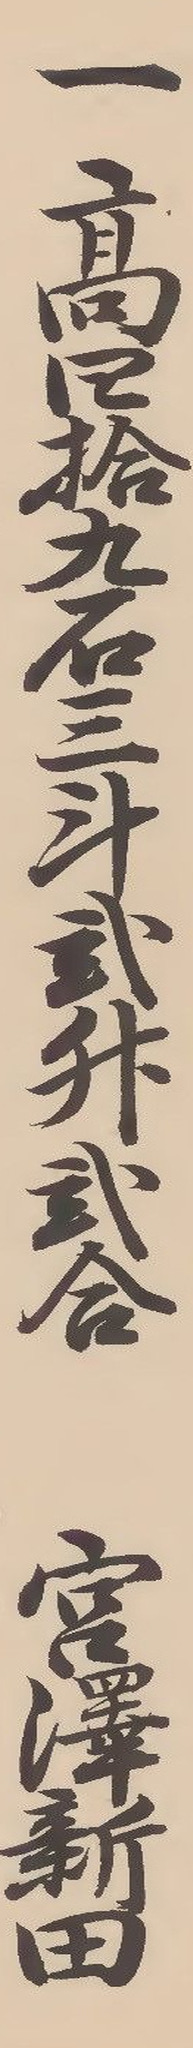一高四拾九石三斗弐升弐合宮沢新田
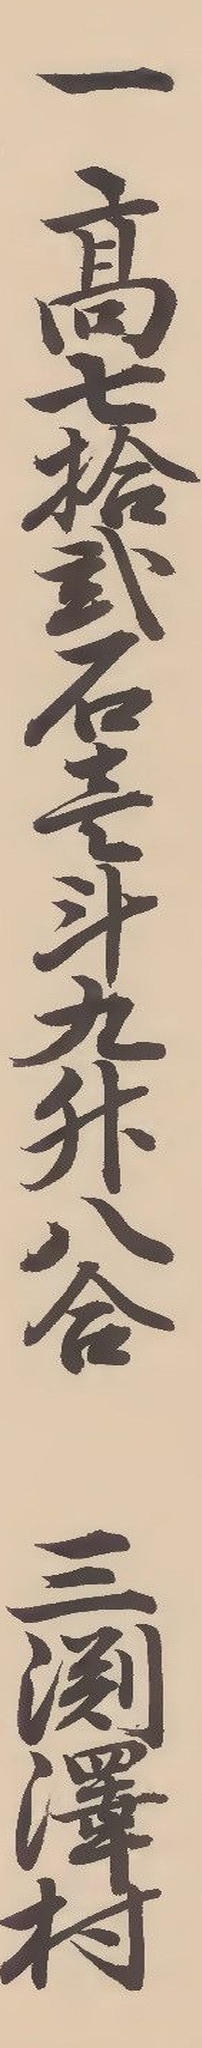一高七拾弐石壱斗九升八合三渕沢村
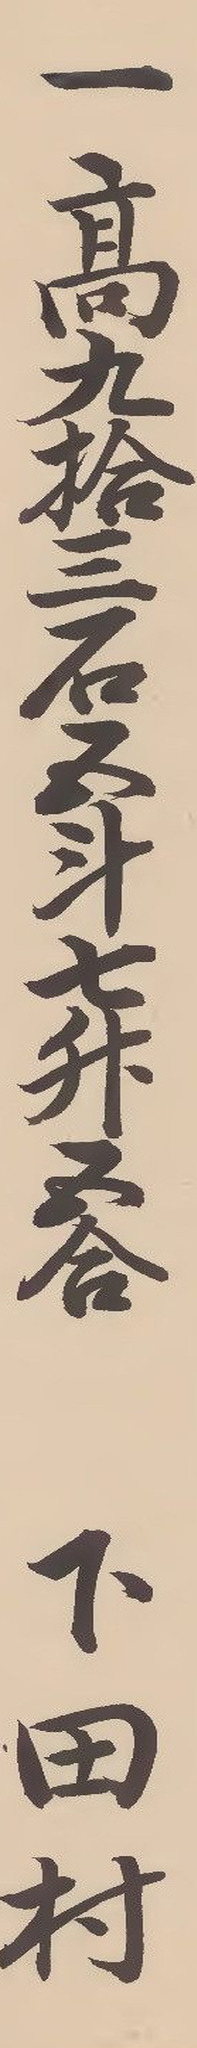一高九拾三石五斗七升五合下田村
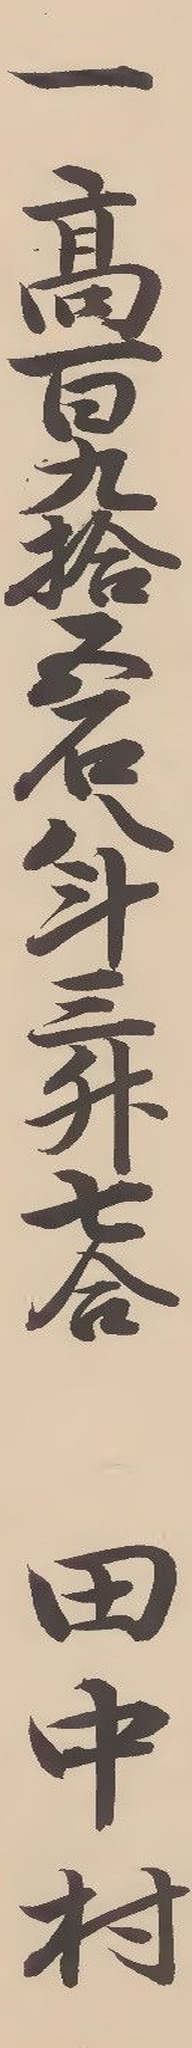一高百九拾五石八斗三升七合田中村
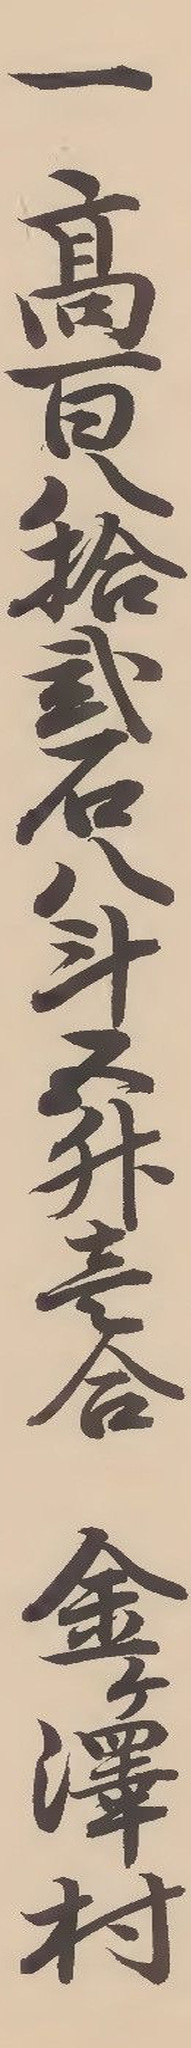一高百八拾弐石八斗五升壱合金ヶ沢村
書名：越後国郷帳　中
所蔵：国立公文書館 National Archives of Japan
